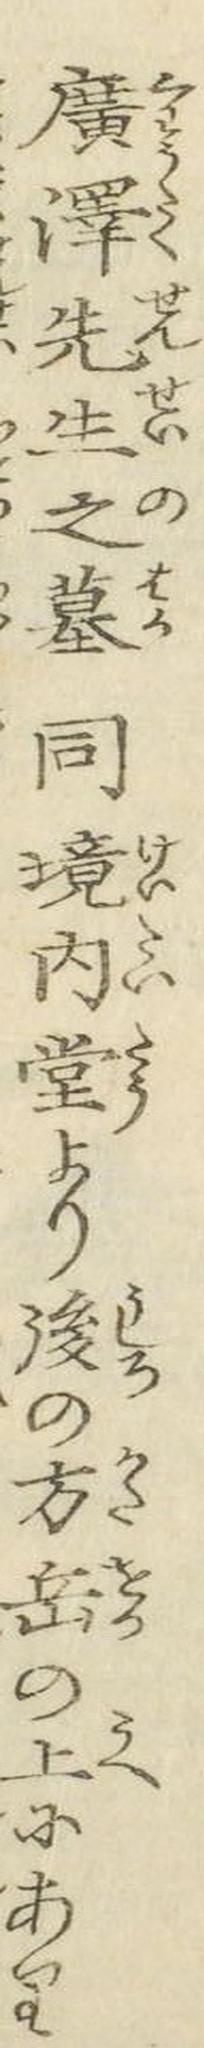廣澤先生之墓同境内堂より後の方岳の上にあり
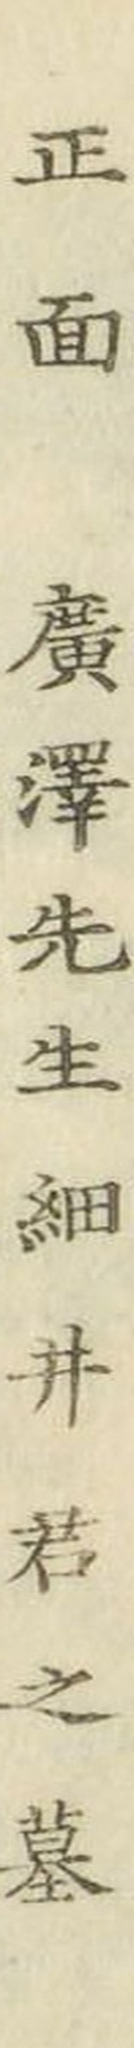正面廣澤先生細井君之墓
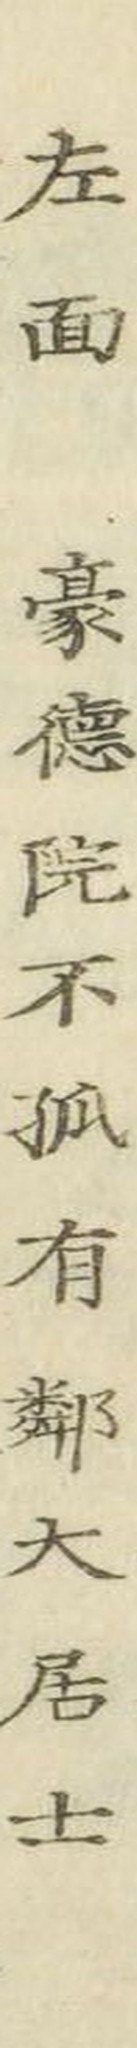左面豪德院不孤有鄰大居士
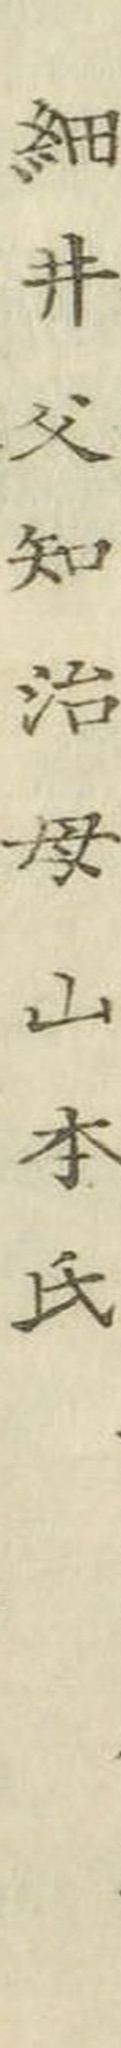細井父知治母山本氏
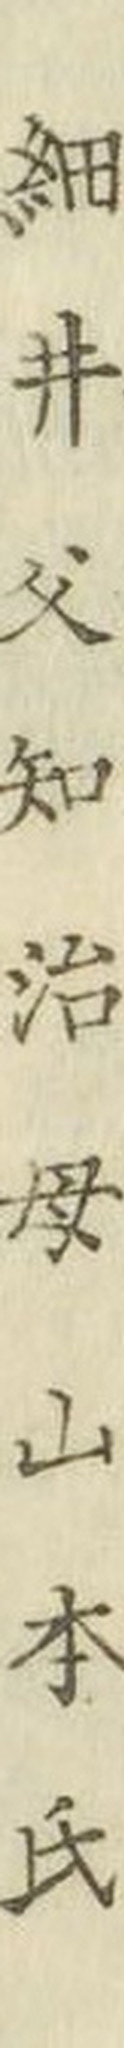細井父知治母山本氏
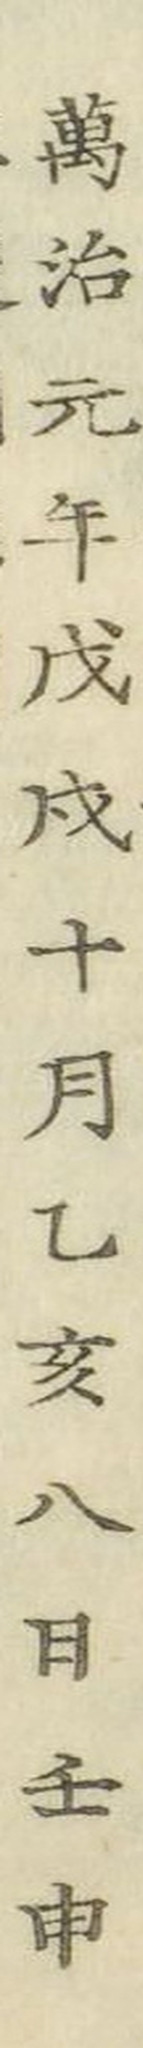萬治元年戊戌十月乙亥八日壬申
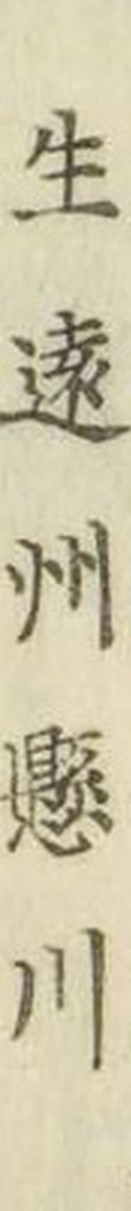生遠州懸川
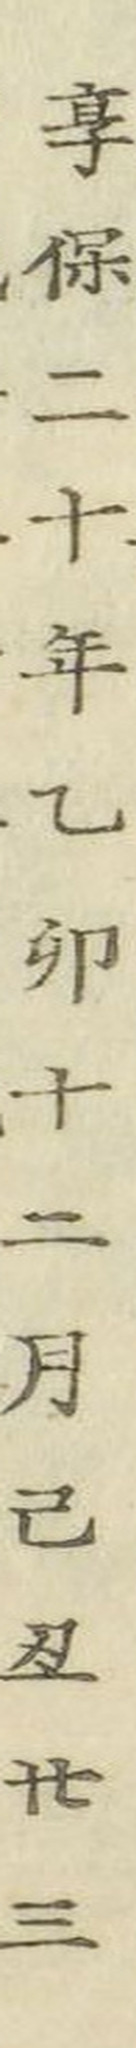享保二十年乙卯十二月己丑廿三
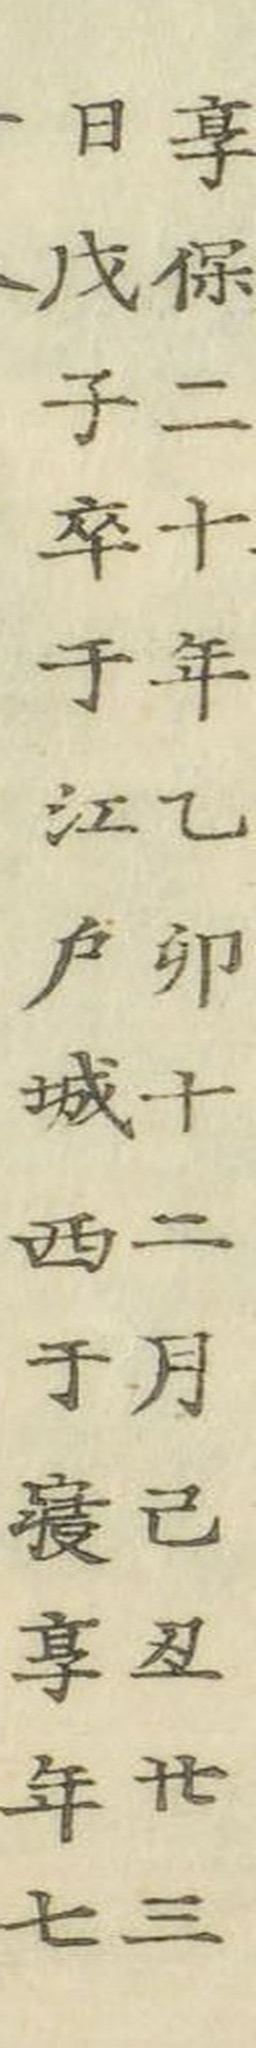右面日戊子卒于江戸城西于寝享年七
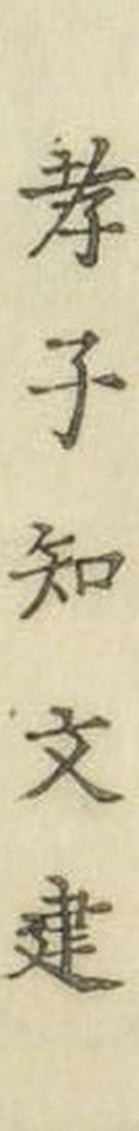孝子知文建
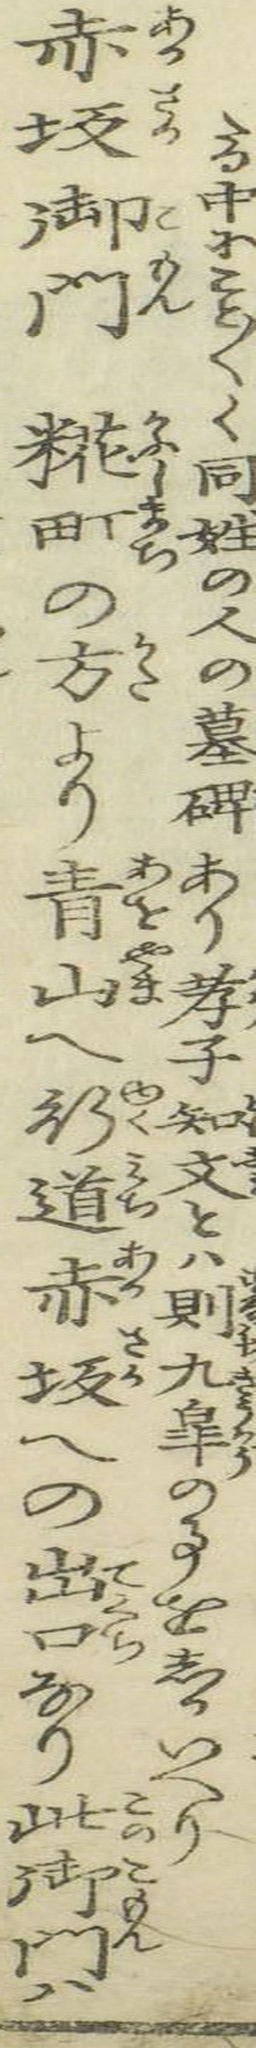赤坂御門糀町の方より青山へ行道赤坂への出口なり此御門は
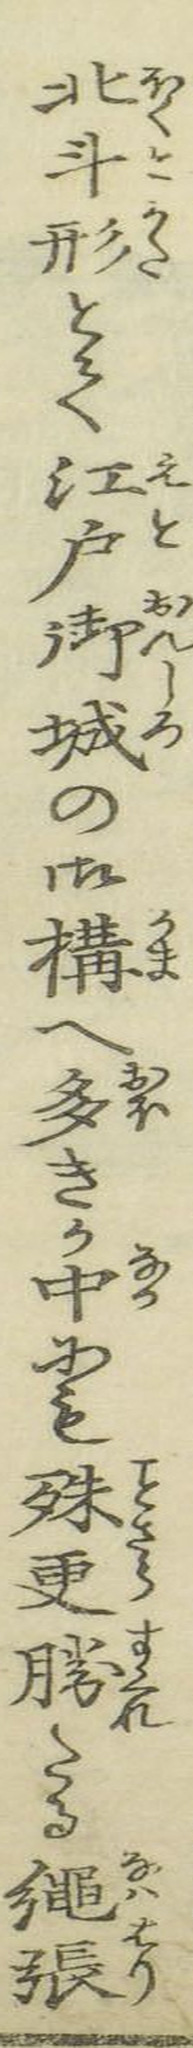北斗形とて江戸御城の御搆へ多きか中にも殊更勝たる繩張

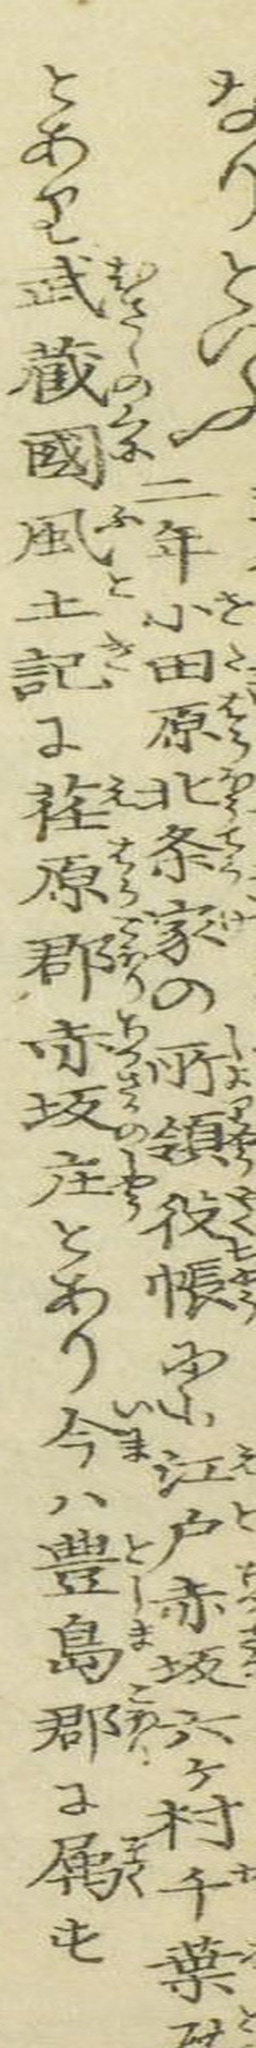とあり武蔵國風土記に荏原郡赤坂庄とあり今は豊島郡に属す
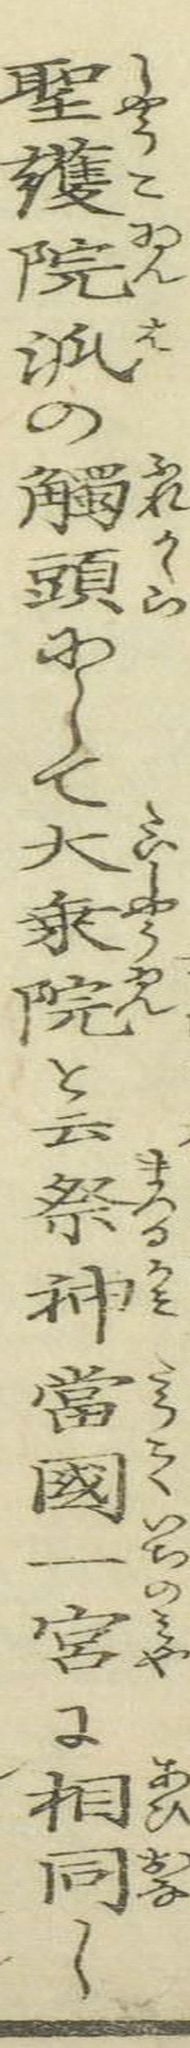聖護院派の觸頭にして大乗院と云祭神當國一宮に相同し
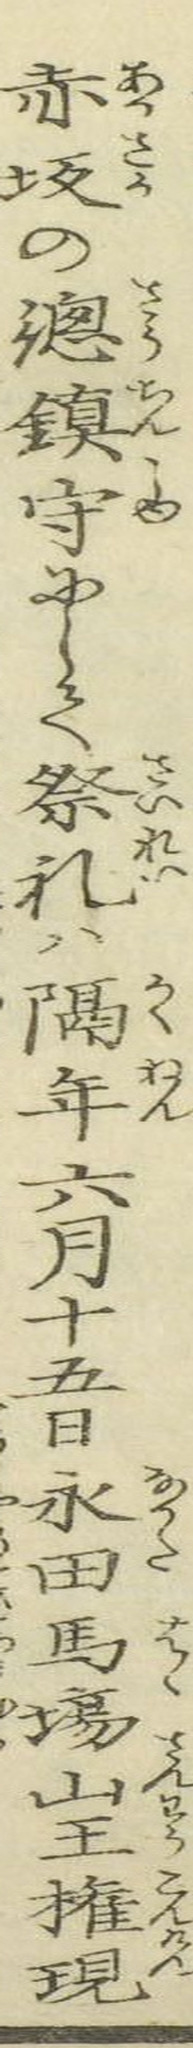赤坂の總鎮守にして祭礼は隔年六月十五日永田馬場山王権現
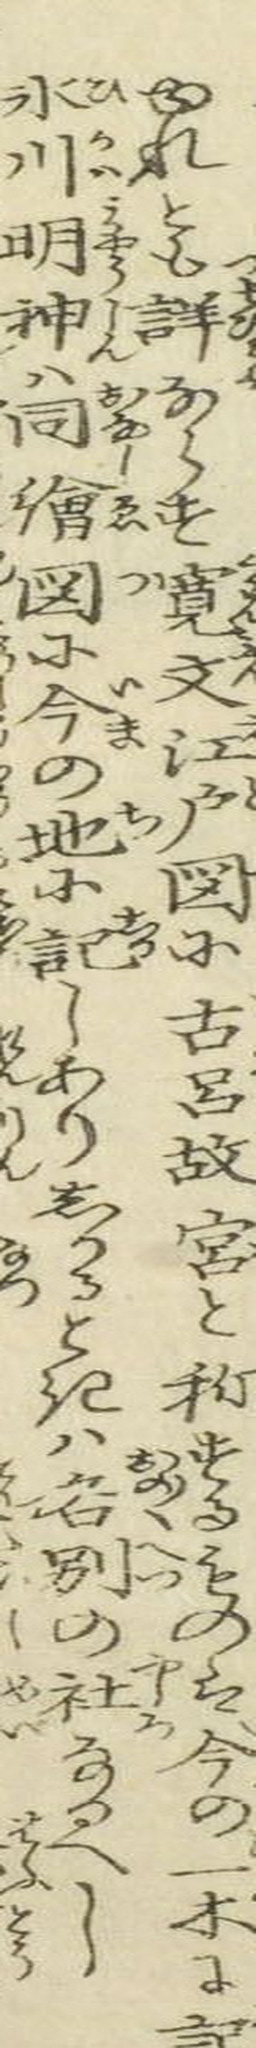氷川明神は同繪図に今の地に記しありしかるときは各別の社なるへし
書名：江戸名所図会 20巻 巻之8
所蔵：東京学芸大学教育コンテンツアーカイブ
